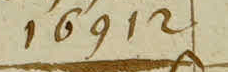16912
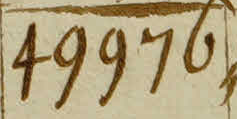49976
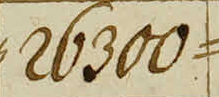26300
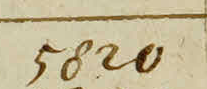5820
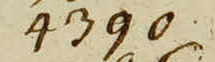4390
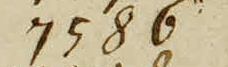7586
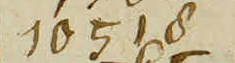10518
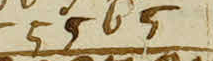5565
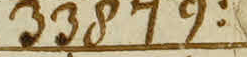33879
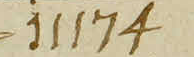11174
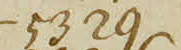5329
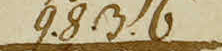9836
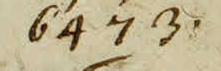6473
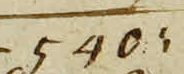540
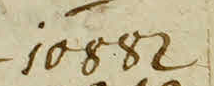10882
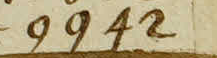9942
